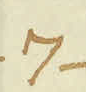7
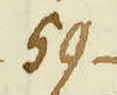59
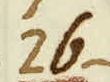26
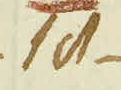18
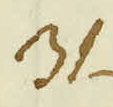31
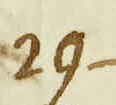29
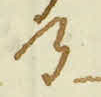3
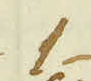1
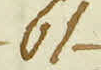61
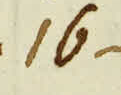16
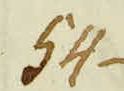54
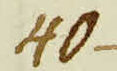40
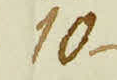10
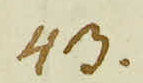43
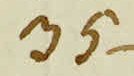35
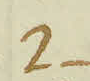2
